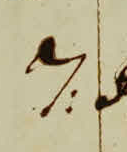7:
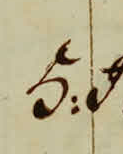5:
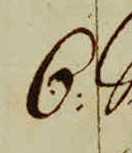6:
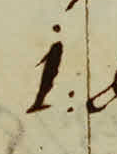1:
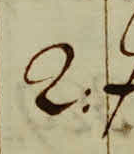2:
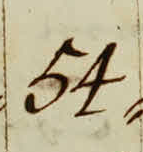54
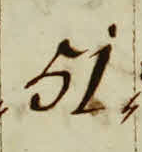51
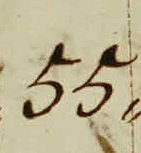55
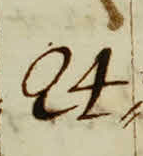24
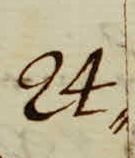24
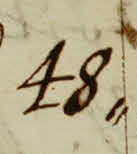48
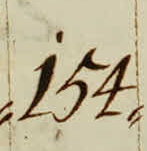154
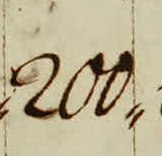200
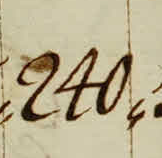240
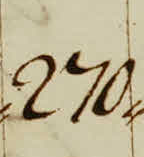270
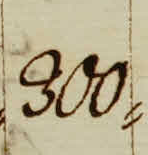300
